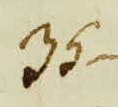35
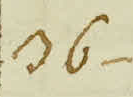36
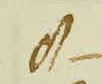8
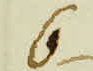6
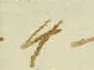4
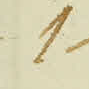1
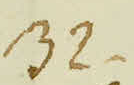32
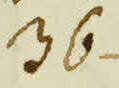36
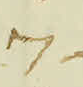7
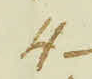4
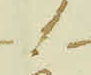1
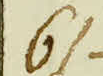61
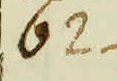62
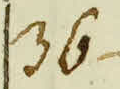36
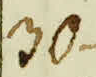30
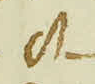8
